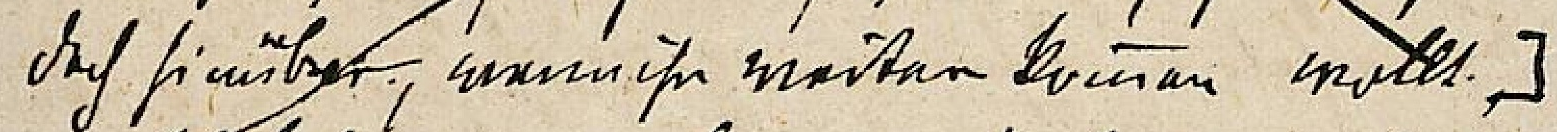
doch hinüber, wenn ihr weiter komen wollt.]
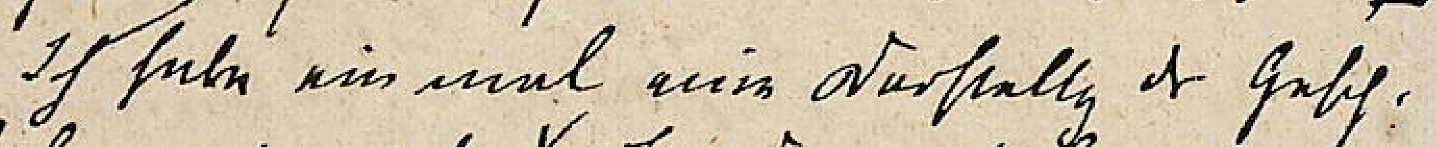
Ich habe einmal eine Dastellg dr Gesch.
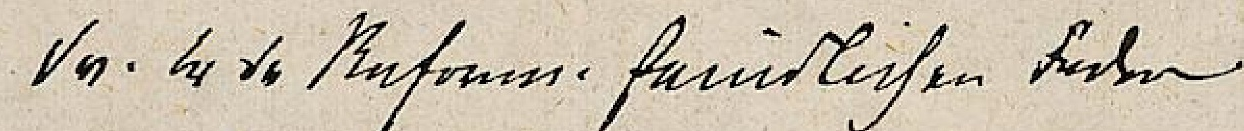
V v 1r dr Reform. feindlichen Feder
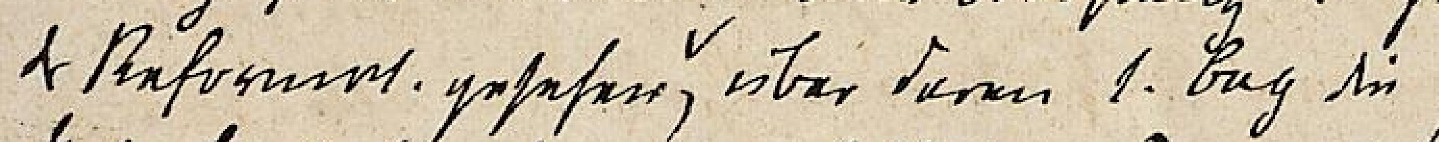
dr Reformat. gesehen, über deren 1. Cap. die
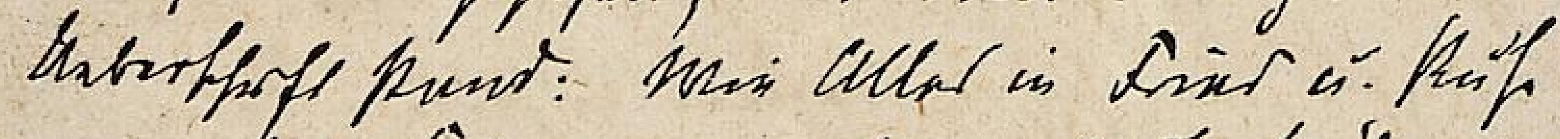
Ueberschrift stand: Wie Alles in Fried u. Ruhe
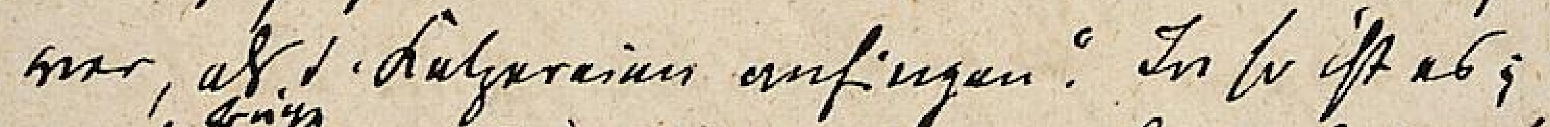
war, als d. Ketzerein anfingen." Ja so ist es;
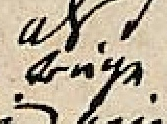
träge
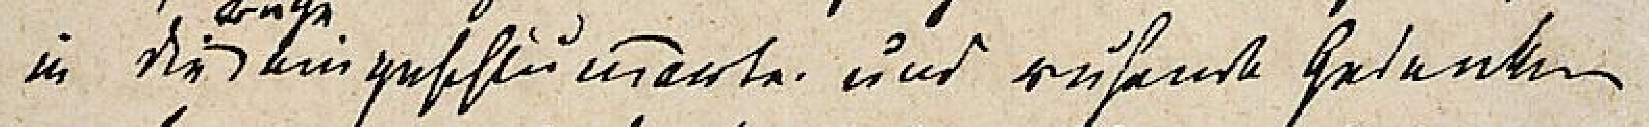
in die eingeschlumerte und ruhende Gedanken
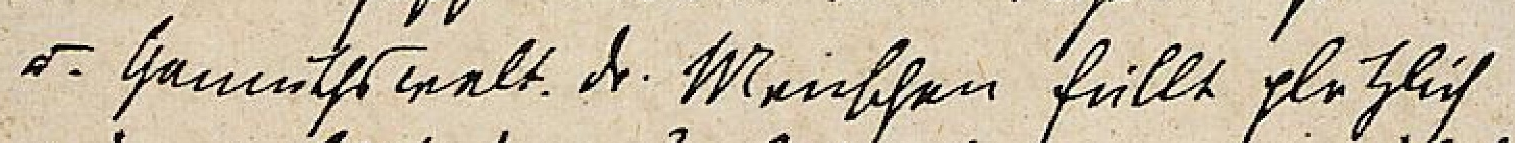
u. Gemüthswelt dr. Menschn fällt plötzlich
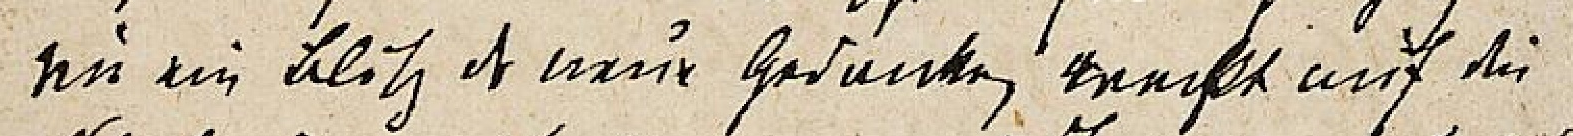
ein ein Blitz dr neue Gedanke, wacht auf die
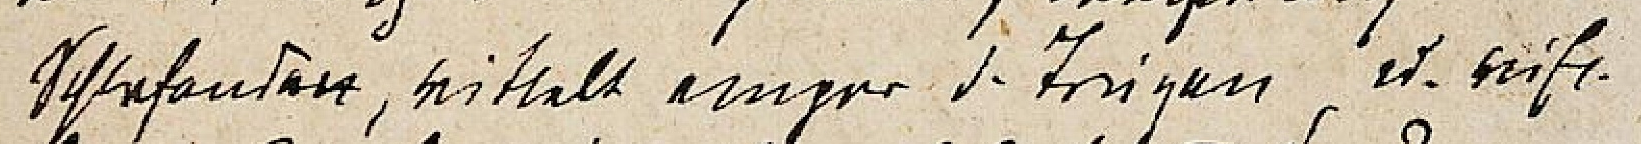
Schlafenden, rüttelt empor d. Trägen, u. ruft
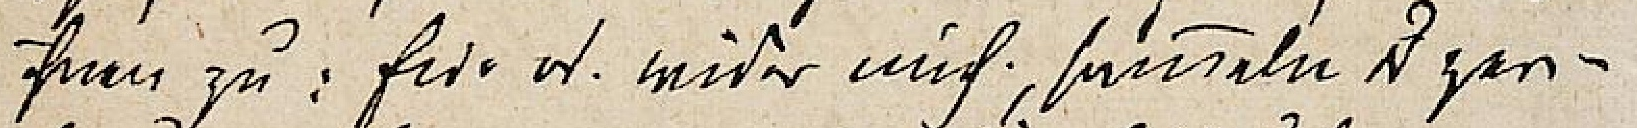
ihnen zu: Für od. wider mich, sameln u. zer¬
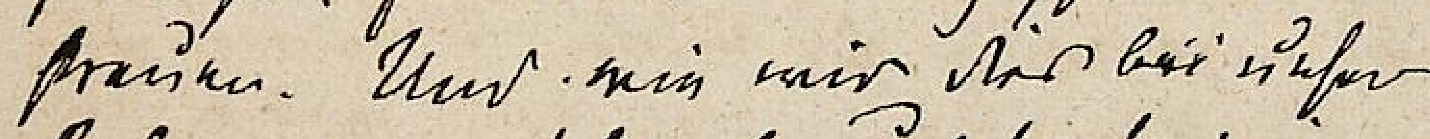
streue. Und wie wir dies bei unser
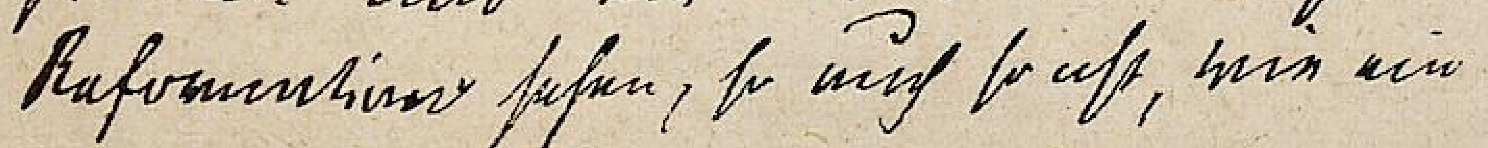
Reformation sehen, so auch so erst, wie ein
